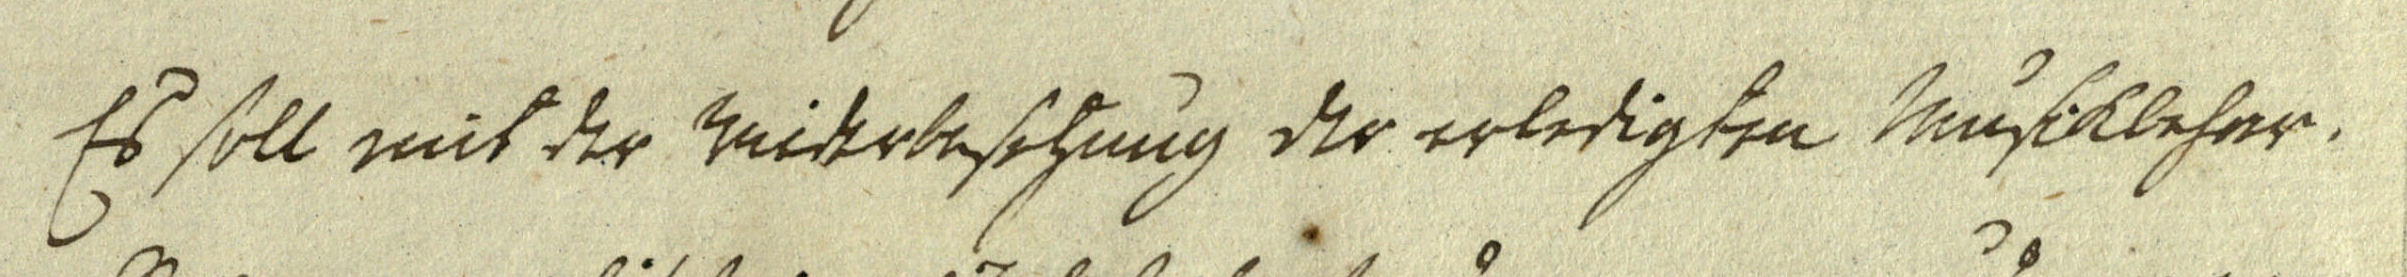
Es soll mit der Wiederbesetzung der erledigten Musiklehrer¬
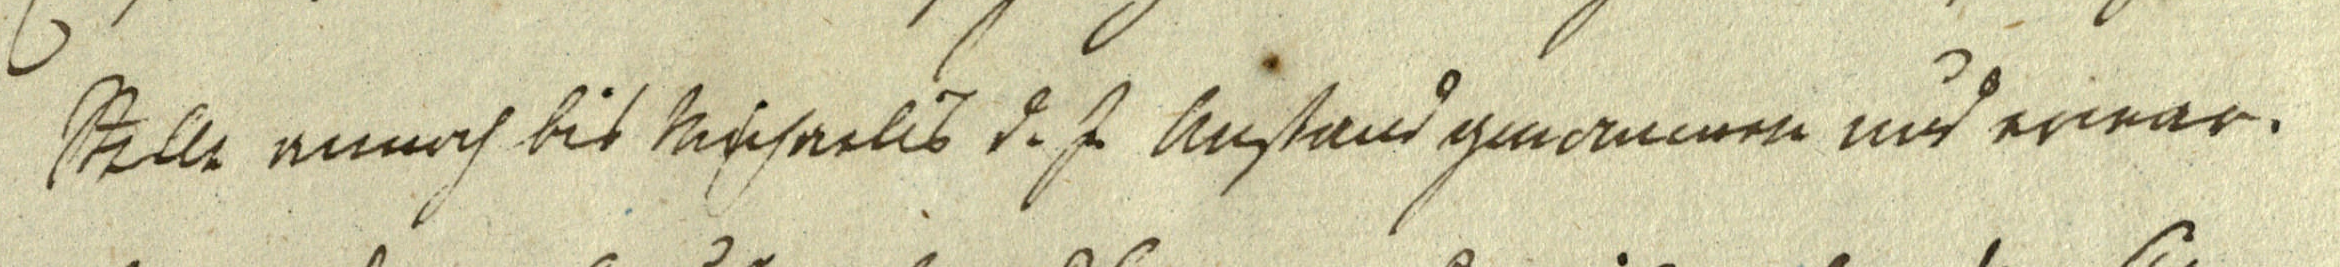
Stelle annoch bis Michaelis d. J. Anstand genommen und erwar¬
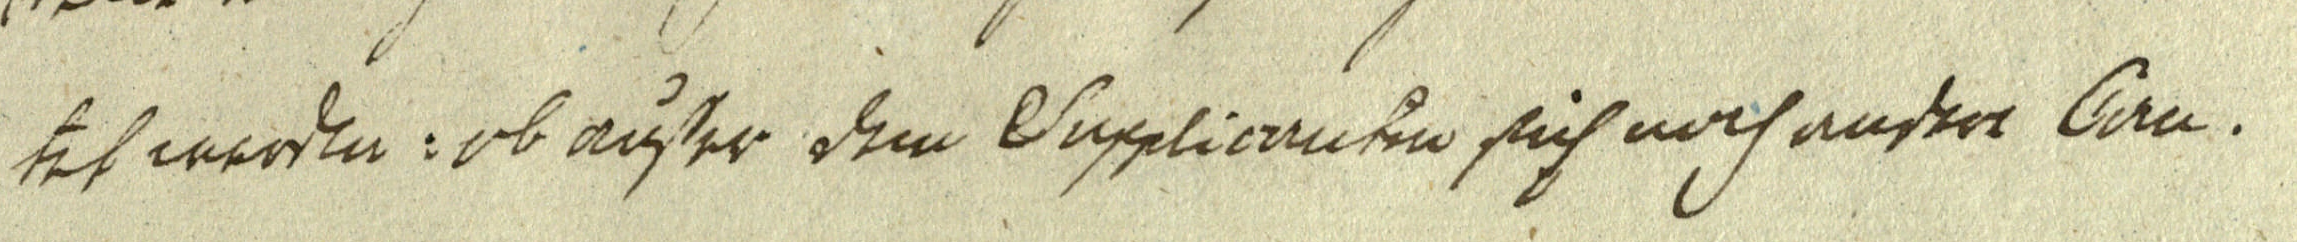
tet werden: ob ausser dem Supplicanten sich noch andere Can¬
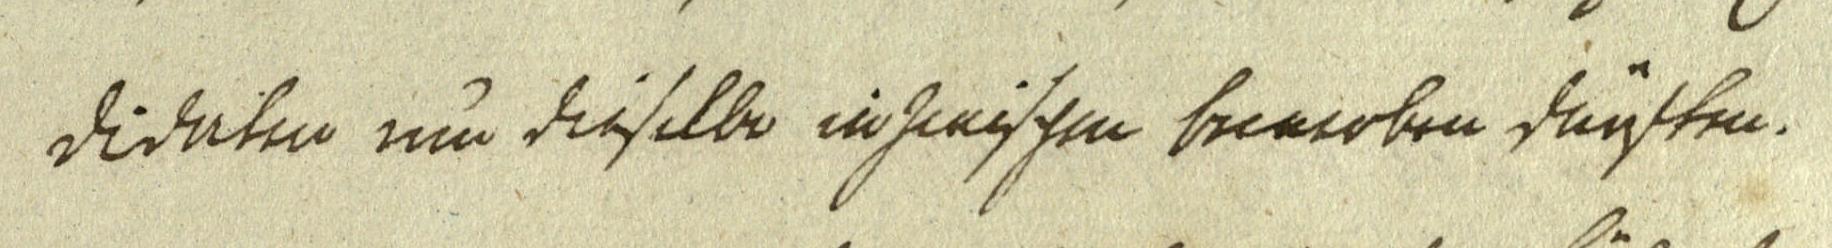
didaten um dieselbe inzwischen bewerben dürften.
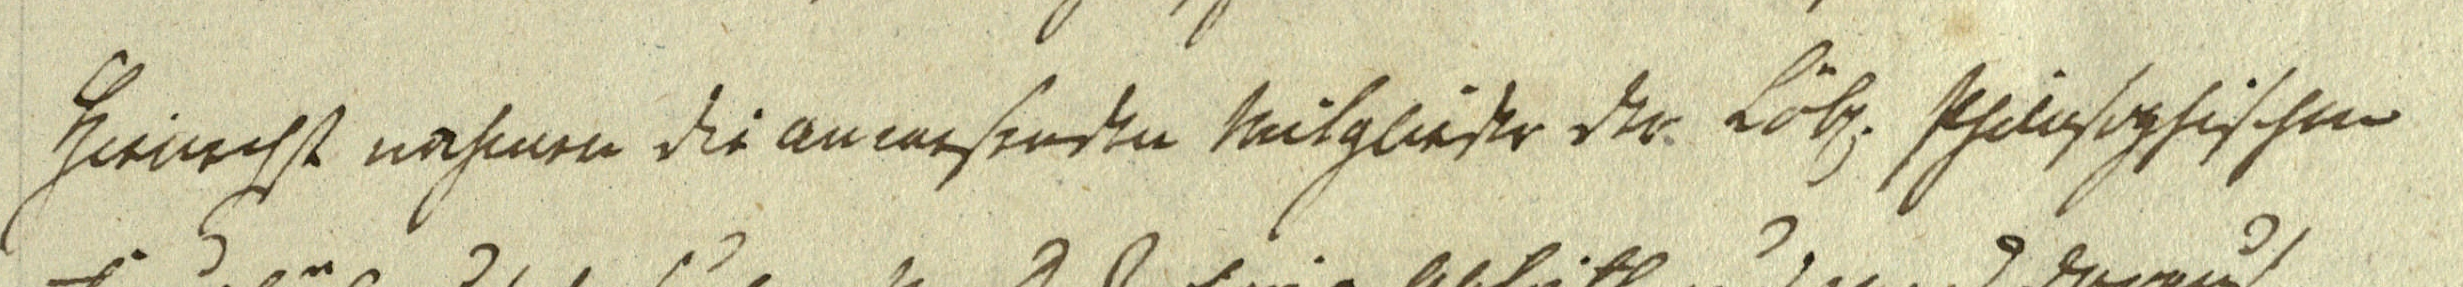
Hienechst nehmen die anwesenden Mitglieder der Löbl. Philosophischen
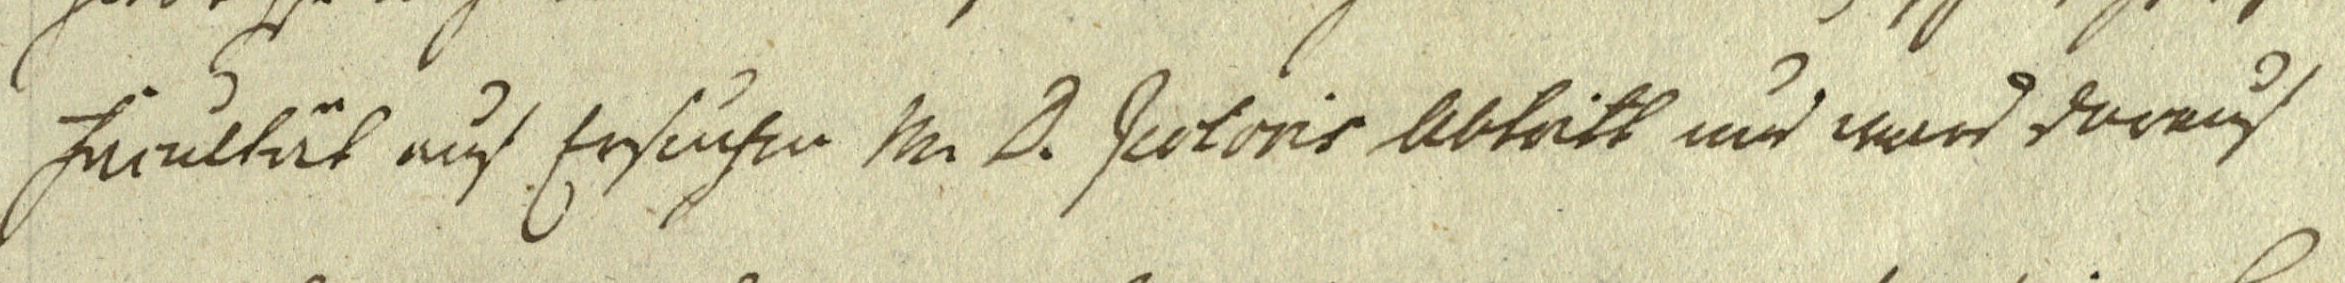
Facultät auf Ersuchen M. D. Rectoris Abtritt und ward darauf
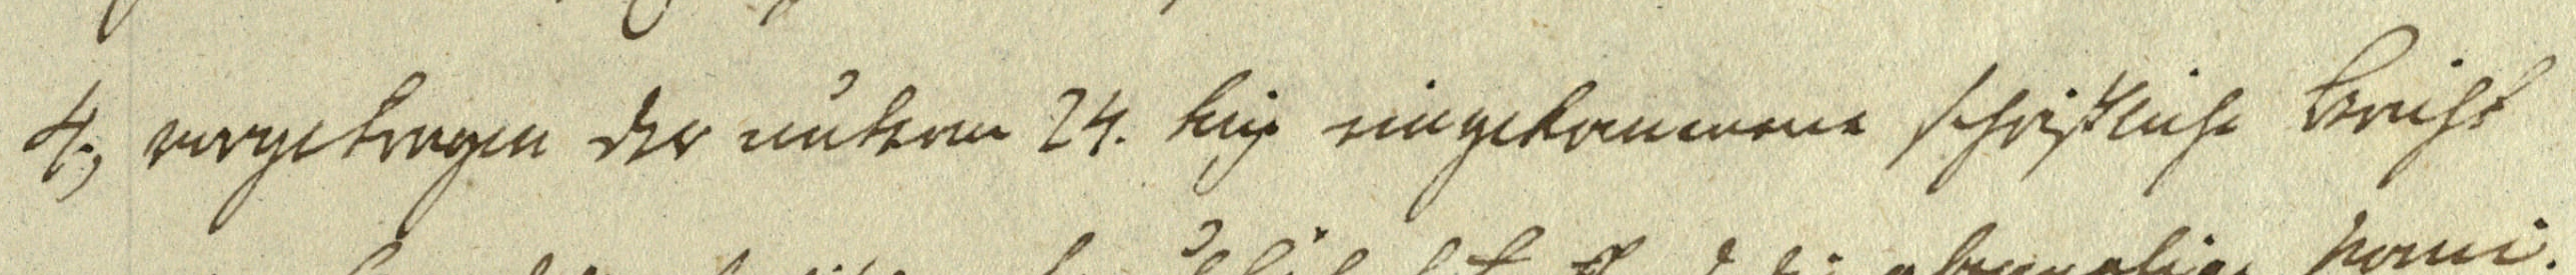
4., vorgetragen der unterm 24. huj. eingekommene schriftliche Bericht
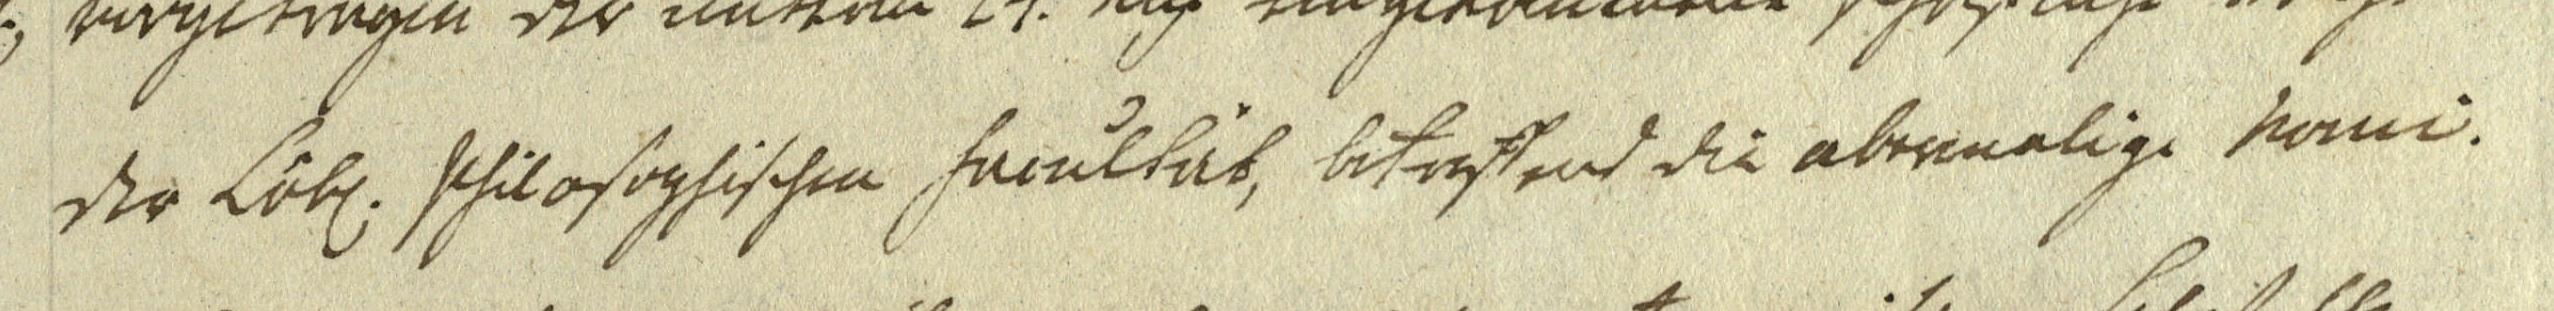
der Löbl. Philosophischen Facultät, betreffend die abermalige Nomi¬
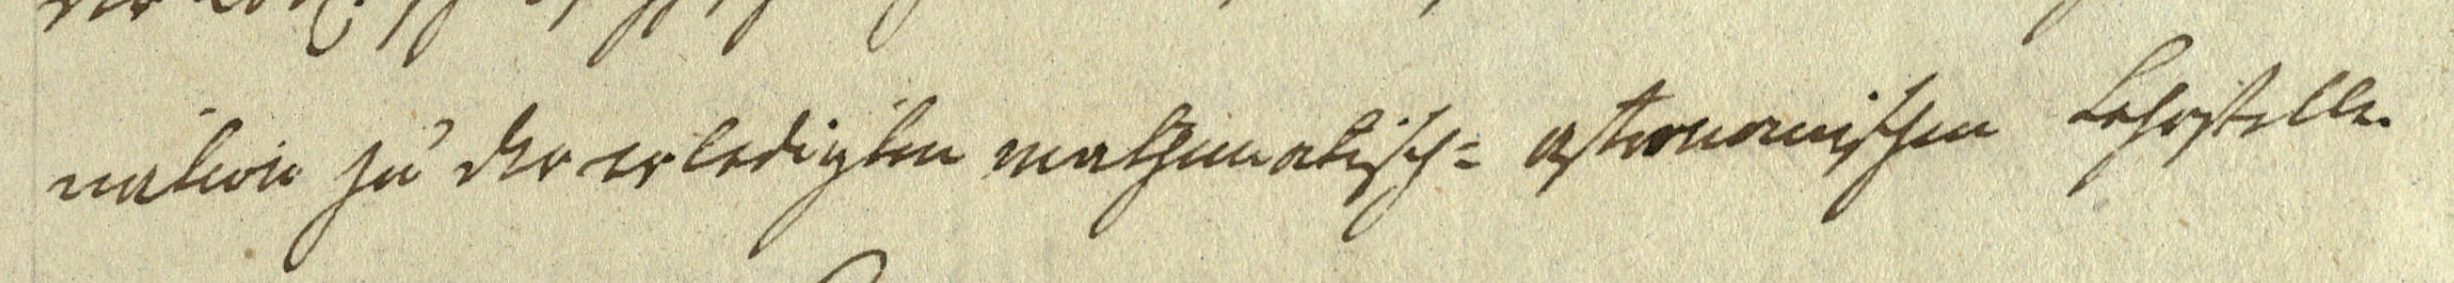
nation zu der erledigten mathematisch- astronomischen Lehrstelle.
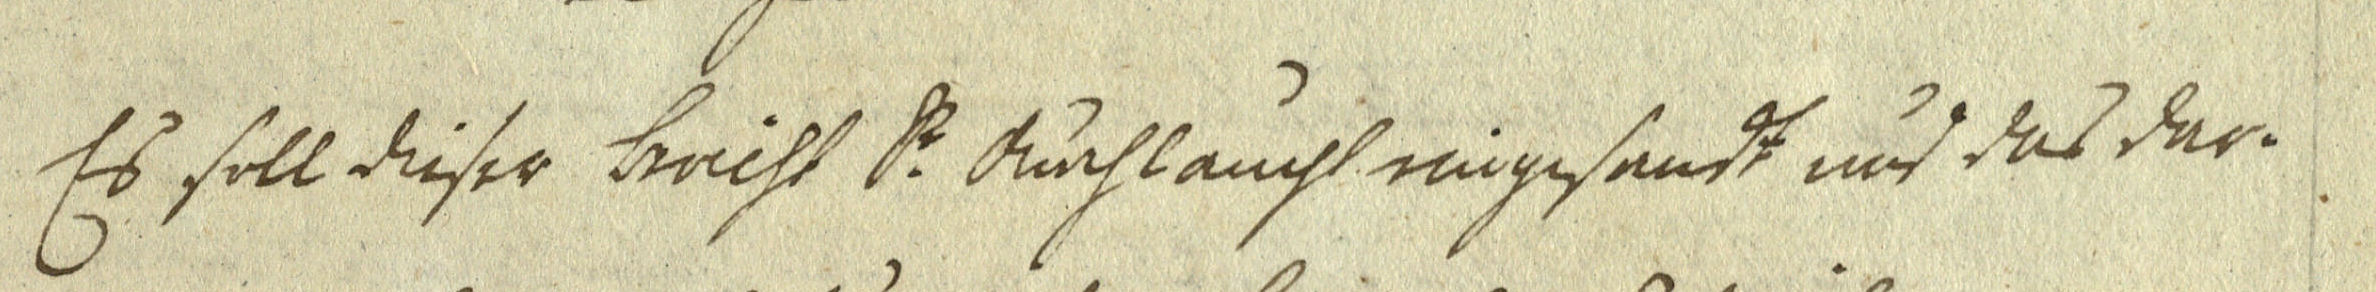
Es soll dieser Bericht Sr. Duchlaucht eingesandt und das dar¬
